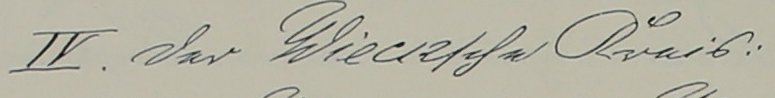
IV. Der Wiecksche Kreis:
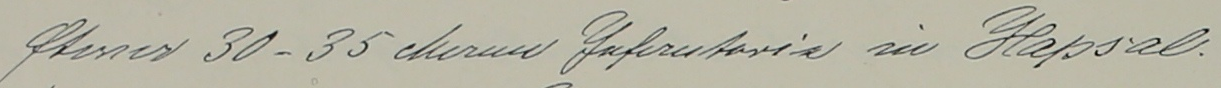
Etwa 30-35 Mann Infanterie in Hapsal
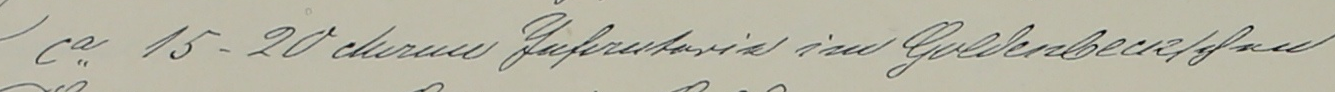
Ca 15-20 Mann Infanterie im Goldenbeckschen
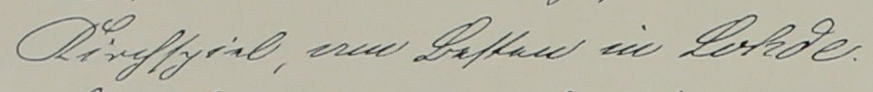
Kirchspiel, am Besten in Lohde.
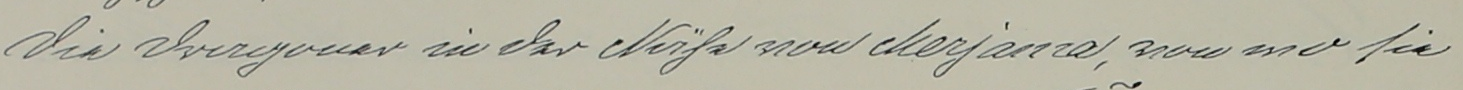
Die Dragoner in der Nähe von Merjama, von wo sie
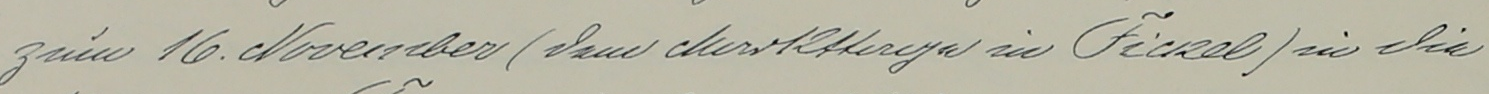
zum 16. November (dem Markttage in Fickel) in die
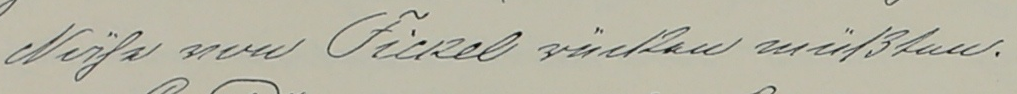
Nähe von Fickel rücken müßten.
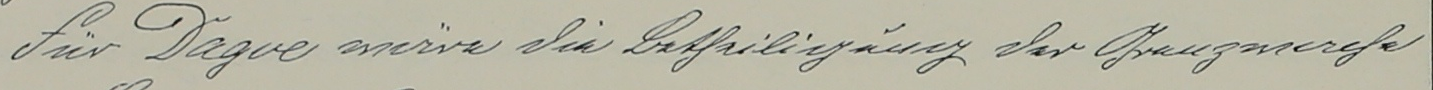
Für Dagoe wäre die Betheiligung der Grenzwache
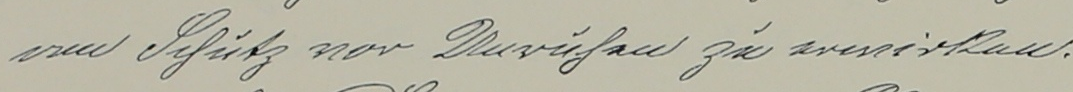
am Schutz vor Unruhen zu erwirken.
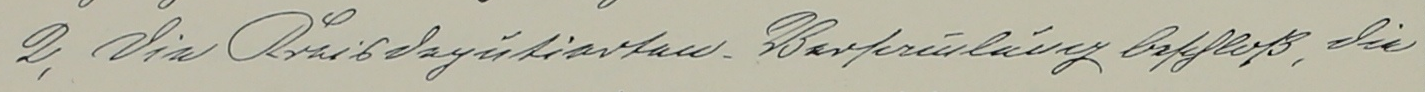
2. Die Kreisdeputierten-Versammlung beschloß, die
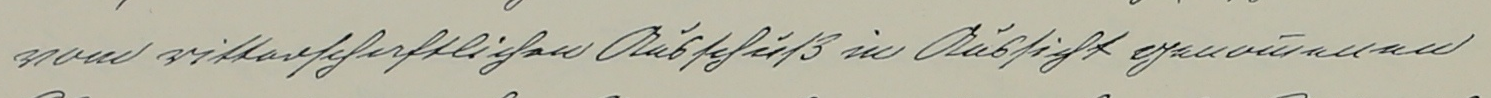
vom ritterschaftlichen Ausschuß in Aussicht genommenen
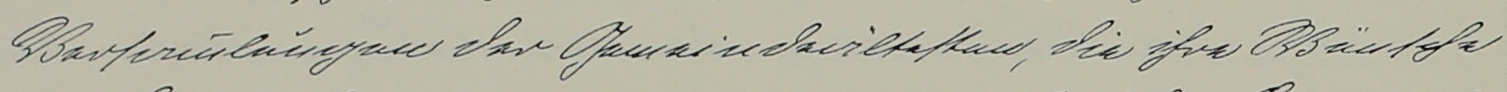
Versammlungen der Gemeindeältesten, die ihre Wünsche
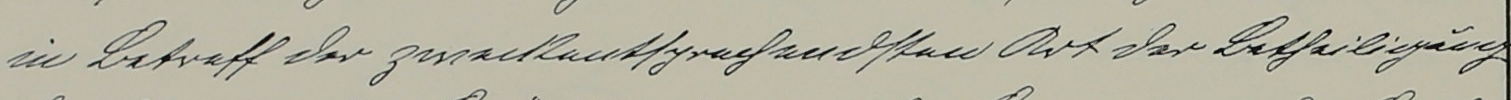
in Betreff der zweckentsprechendsten Art der Betheiligung
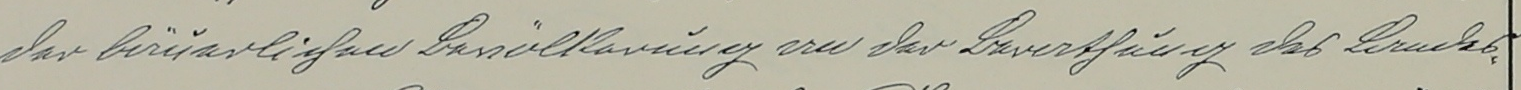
der bäuerlichen Bevölkerung an der Berathung des Landes-
